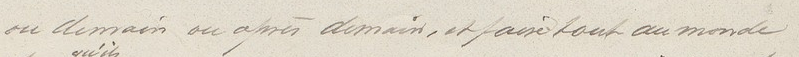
ou demain ou après demain, et faire tout au monde
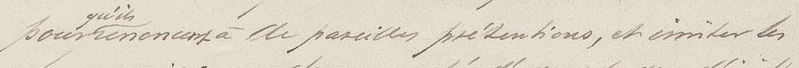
pour qu'ils renoncent à de pareilles prétentions, et imiter les
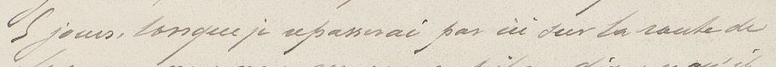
5 jours, lorsque je repasserai pas ici sur la route de
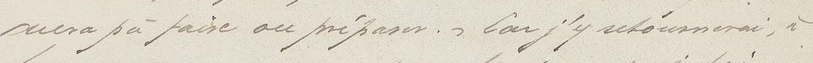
ne sera pû faire ou préparer. – Car j'y retournerai, à
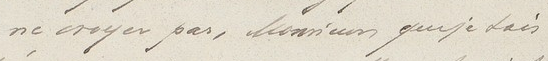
ne croyez pas, Monsieur, que je sois
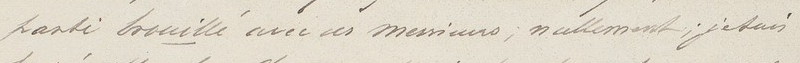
parti brouillé avec ces Messieurs; nullement; j'etais
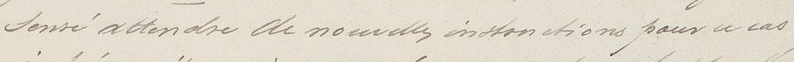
sensé attendre de nouvelles instructions pour ce cas
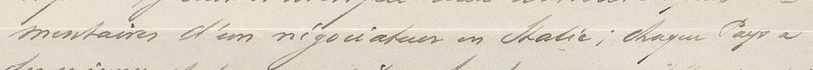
mentaires d'un négociateur en Italie; chaque Pays a
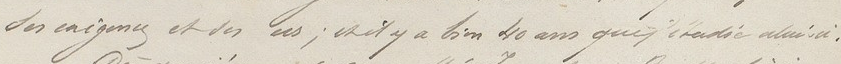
ses exigences, et des cas; et il y a bien 40 ans que j'étudie celui-ci.
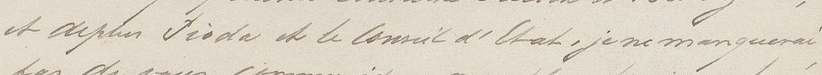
et deplus Pioda et le Conseil d'Etat, je ne manquerai
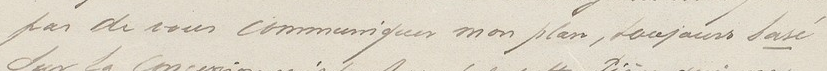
pas de vous communiquer mon plan, toujours basé
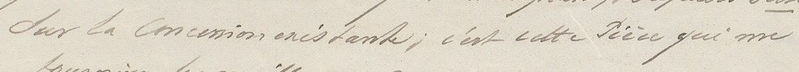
sur la Concession existante; c'est cette Pièce qui me
